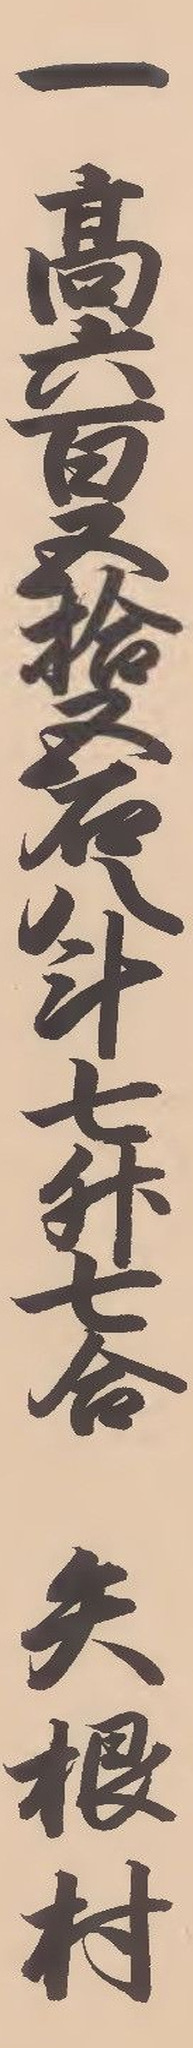一高六百五拾五石八斗七升七合矢根村
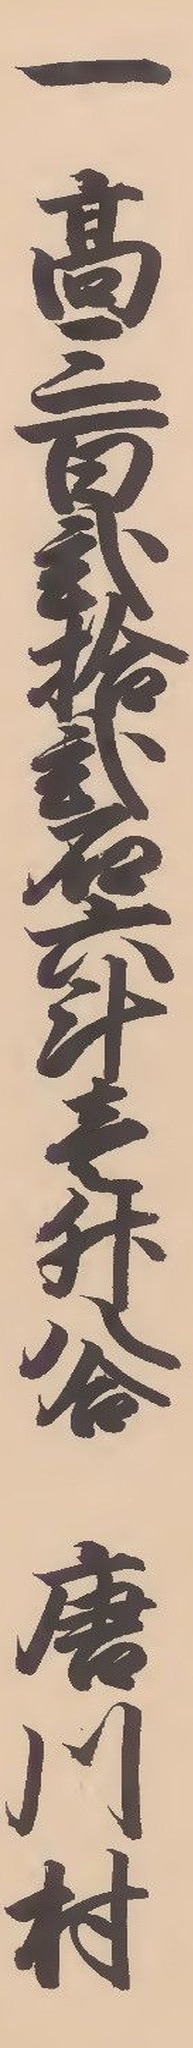一高三百弐拾弐石六斗壱升八合唐川村

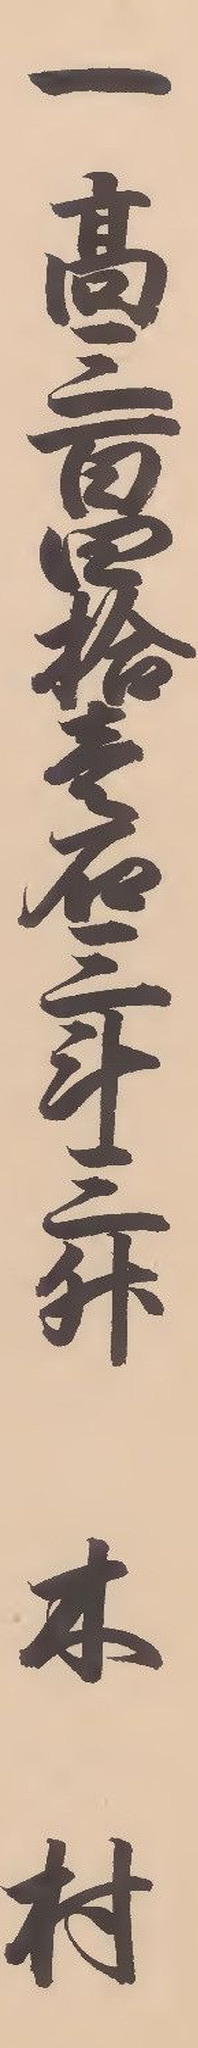一高三百四拾壱石三斗三升木村
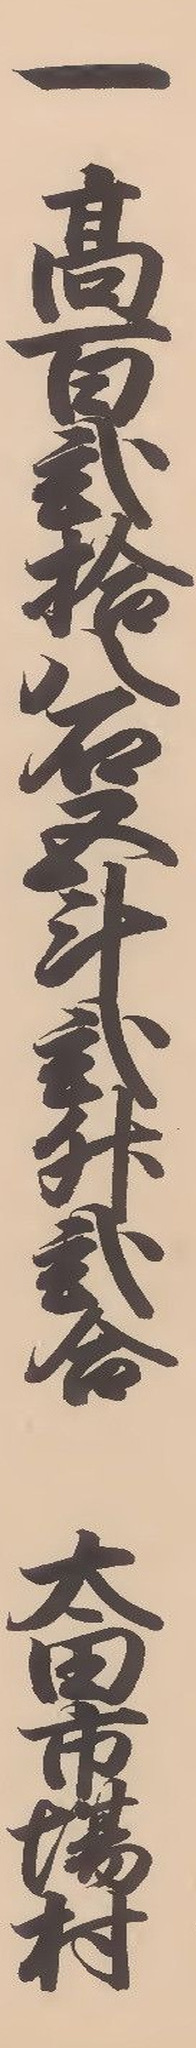一高百弐拾八石五斗弐升弐合太田市場村
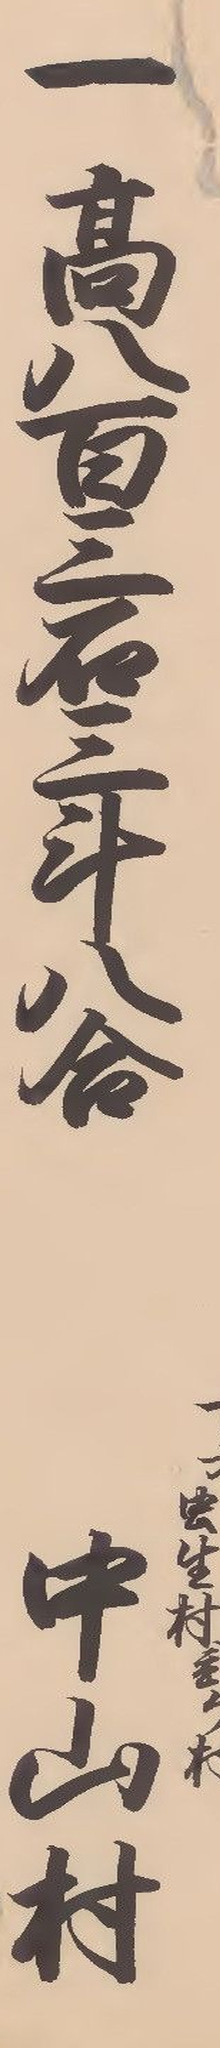一高八百三石三斗八合中山村
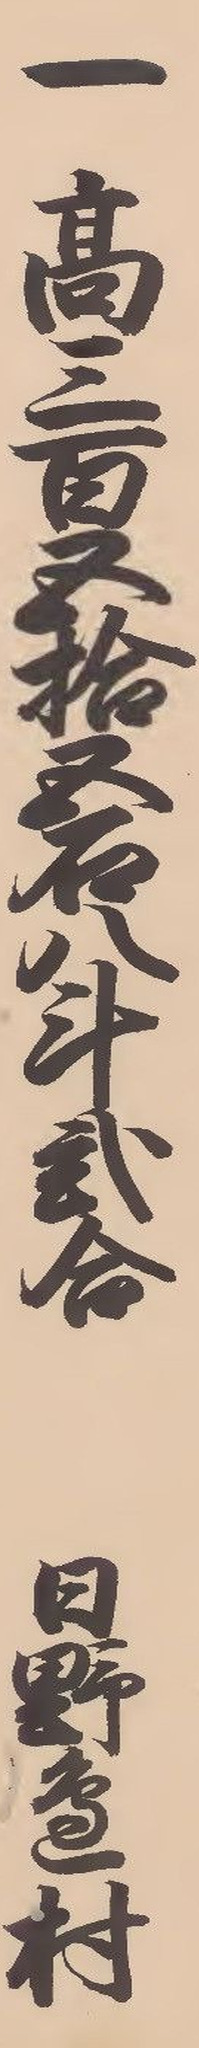一高三百五拾五石八斗弐合日野辺村
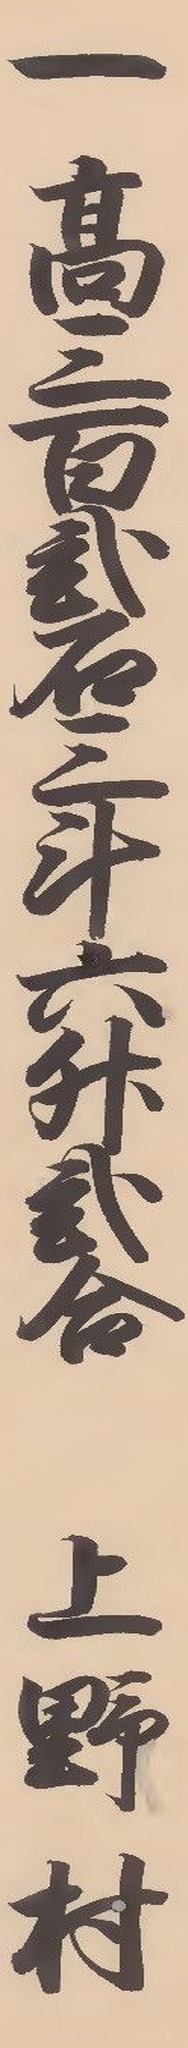一高三百弐石三斗六升弐合上野村
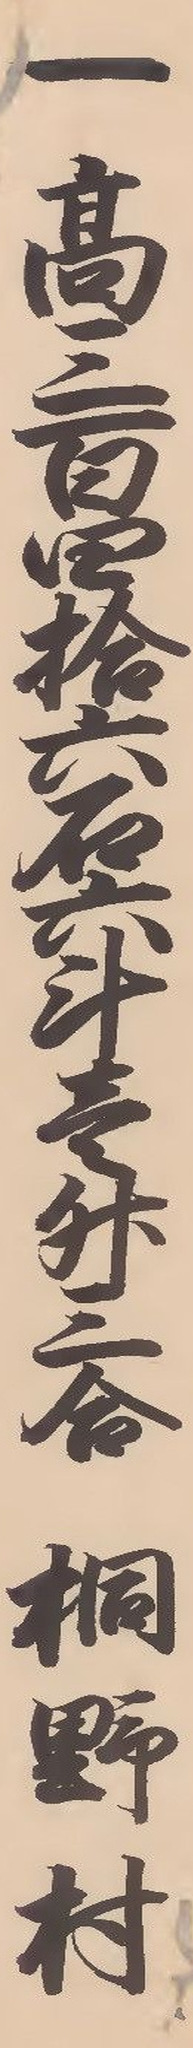一高三百四拾六石六斗壱升三合桐野村
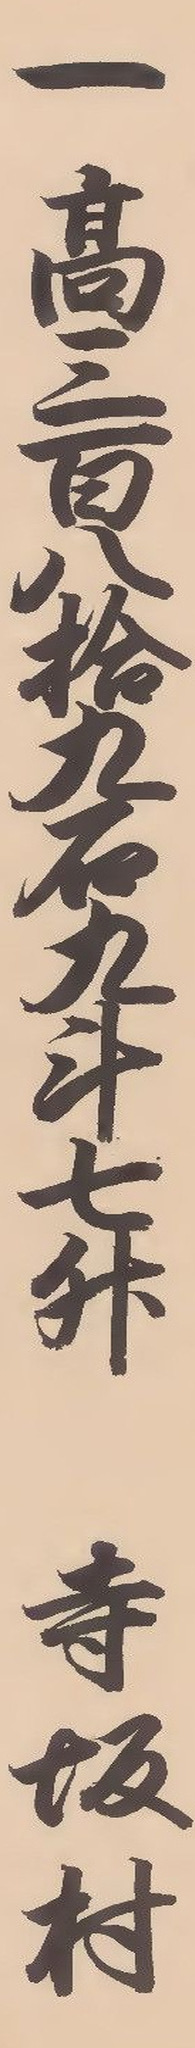一高三百八拾九石九斗七升寺坂村
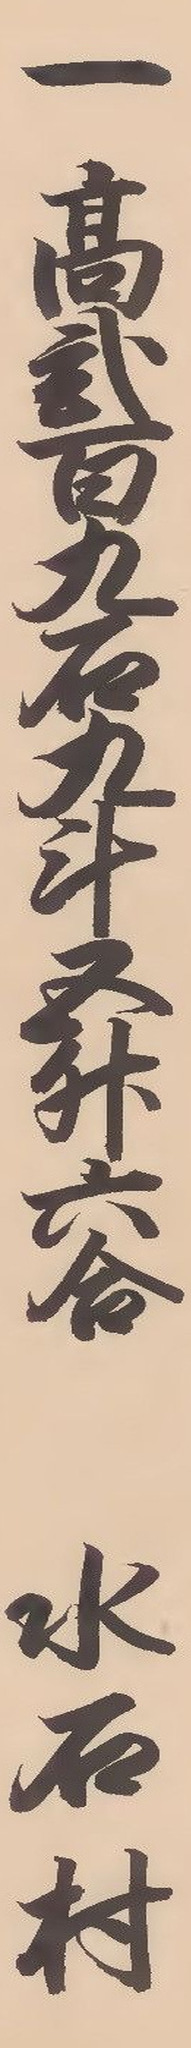一高弐百九石九斗五升六合水石村

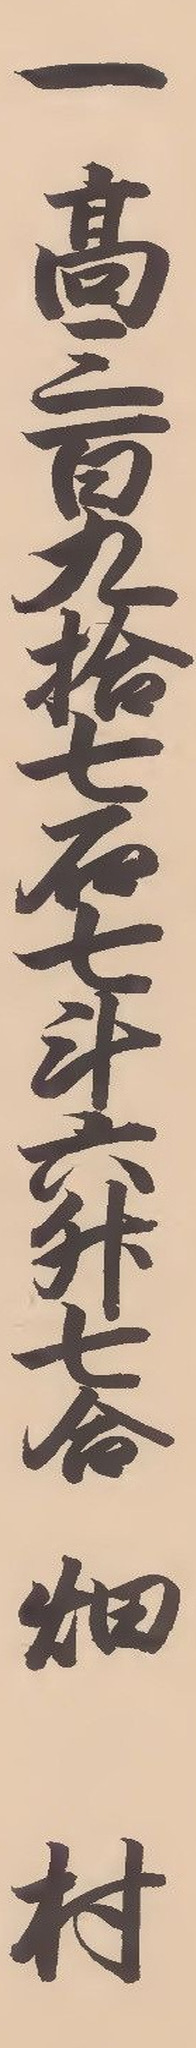一高三百九拾七石七斗六升七合畑村
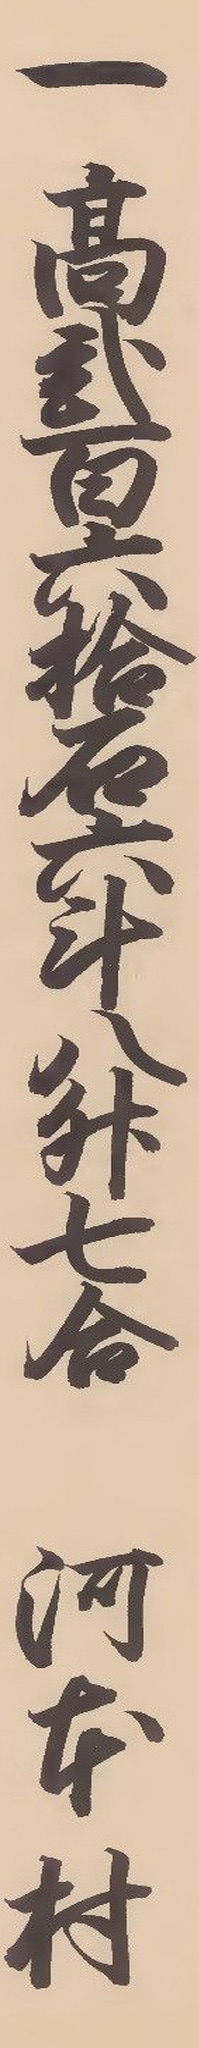一高弐百六拾石六斗八升七合河本村
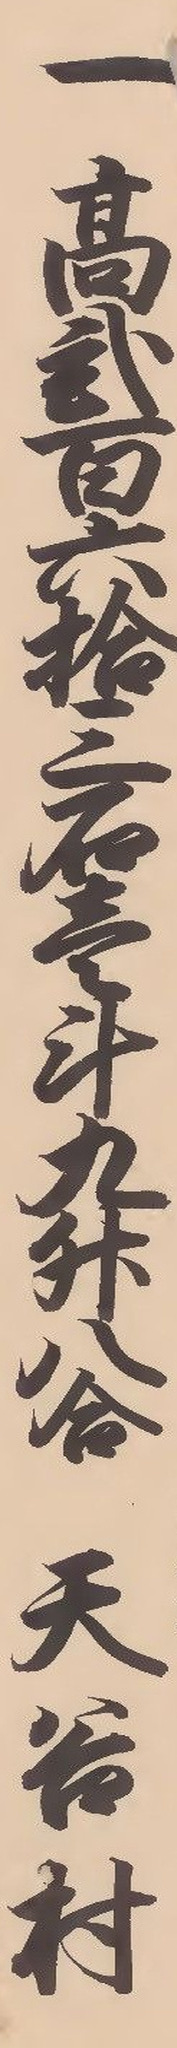一高弐百六拾三石壱斗九升八合天谷村
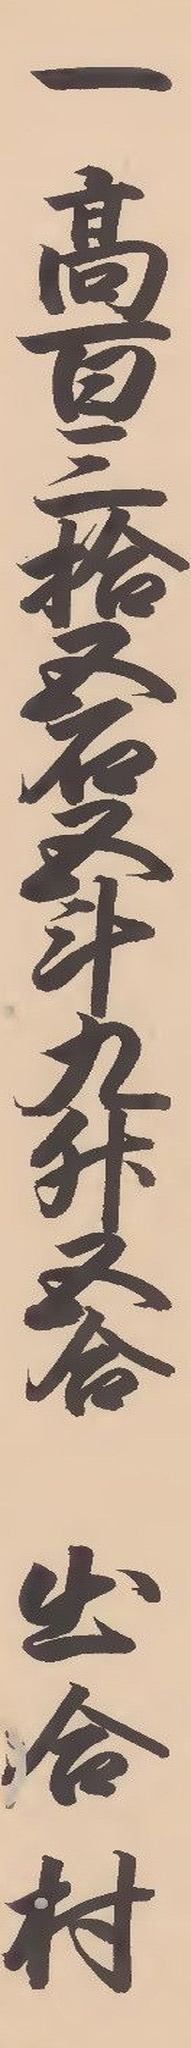一高百三拾五石五斗九升五合出合村
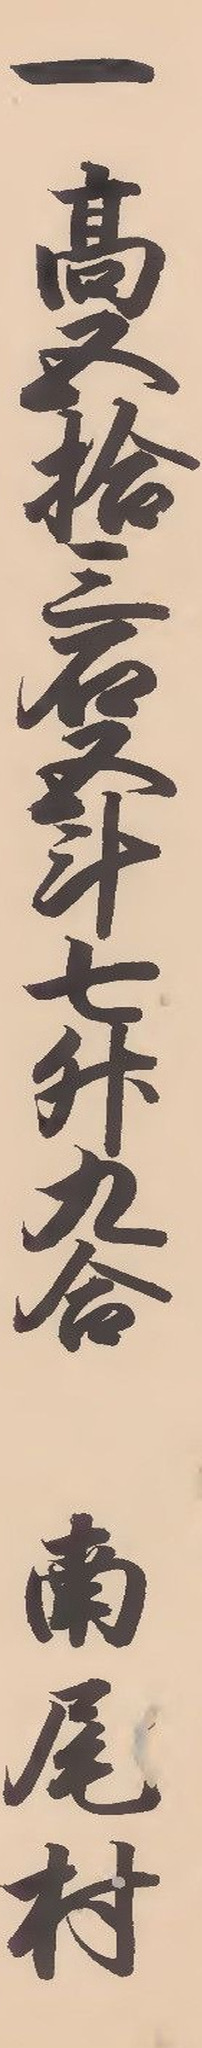一高五拾三石五斗七升九合南尾村
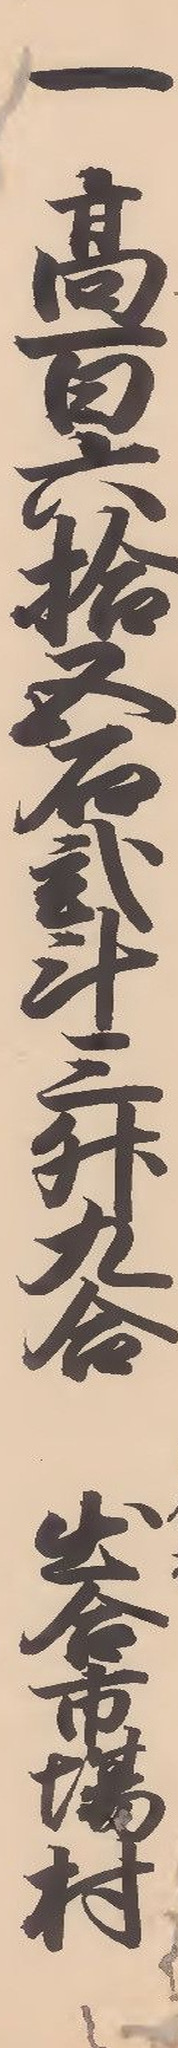一高百六拾五石弐斗三升九合出合市場村
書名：但馬国郷帳
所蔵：国立公文書館 National Archives of Japan
